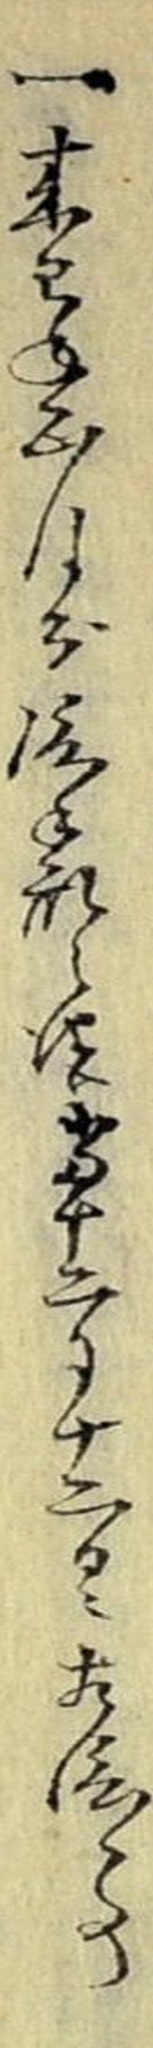一来巳年正月分渡手形之儀は当十二月十二日に相渡候事
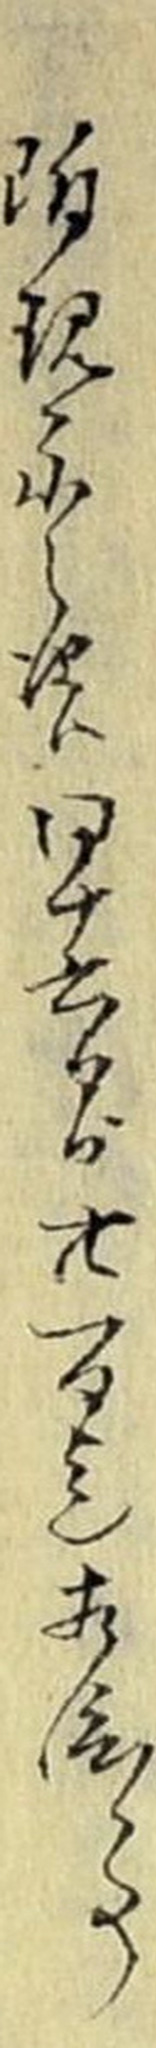附現米之儀は同十六日ゟ廿一日迄相渡候事
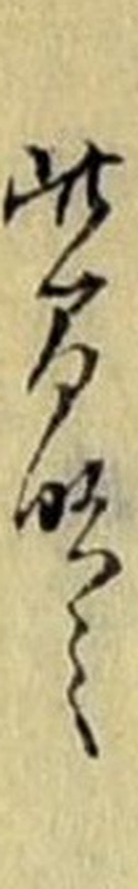此間略之

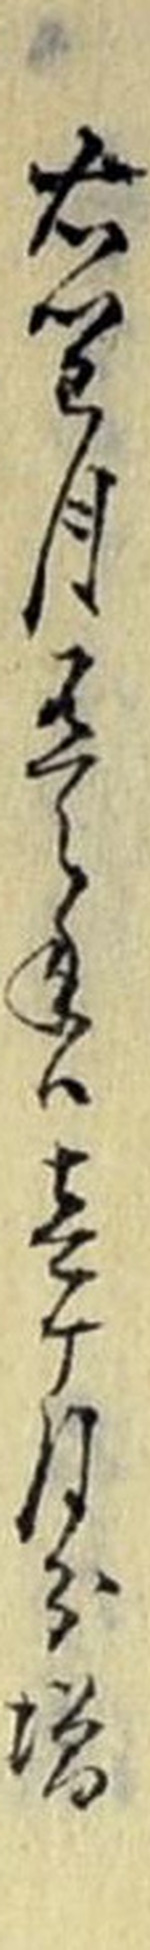右閏月有之年は壱ヶ月分増
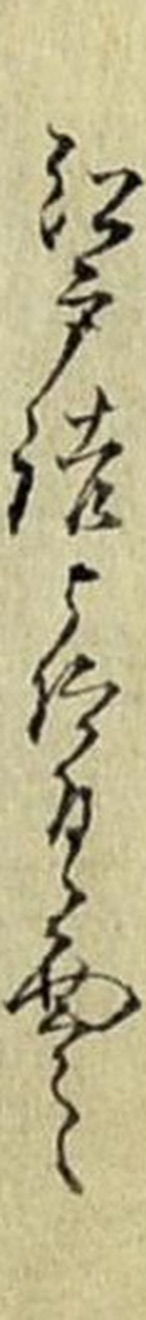江戸詰被仰付候面々へ
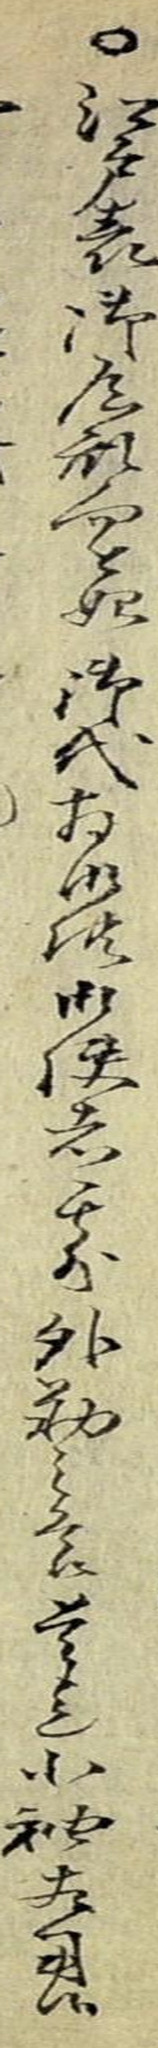○江戸表御屋形向を始御代拝御供御使者其外勤候節是迄小袖相用候
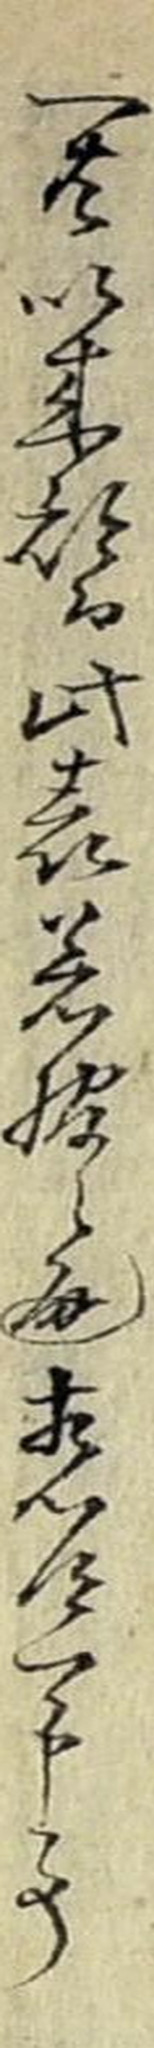へ共以来都而此表着服之通相心得可申事
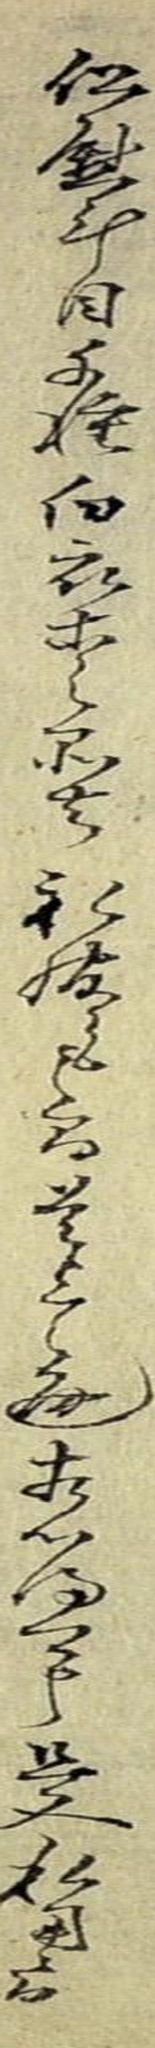但熨斗目千種白衣等之品は礼服にも候間是迄之通相心得可申且又私用に而
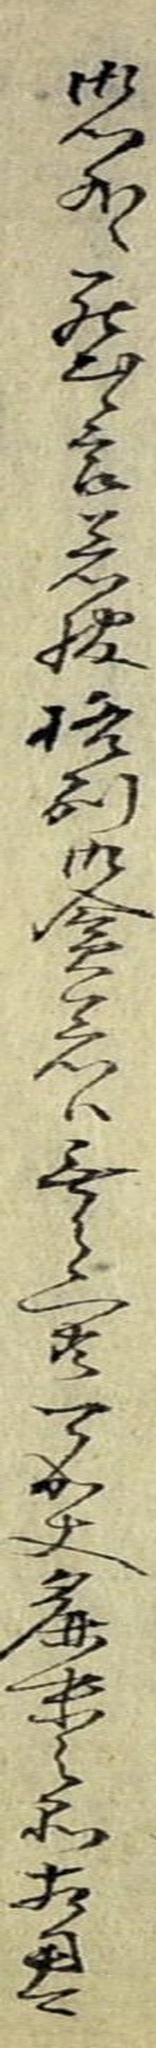御門外へ罷出候節着服格別御貪着は無之候へ共可成丈麁末之品相用可
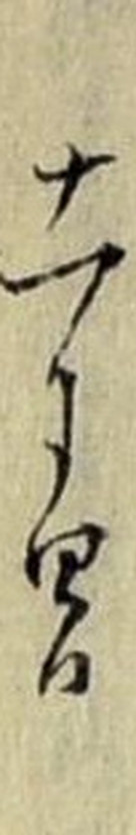十一月四日
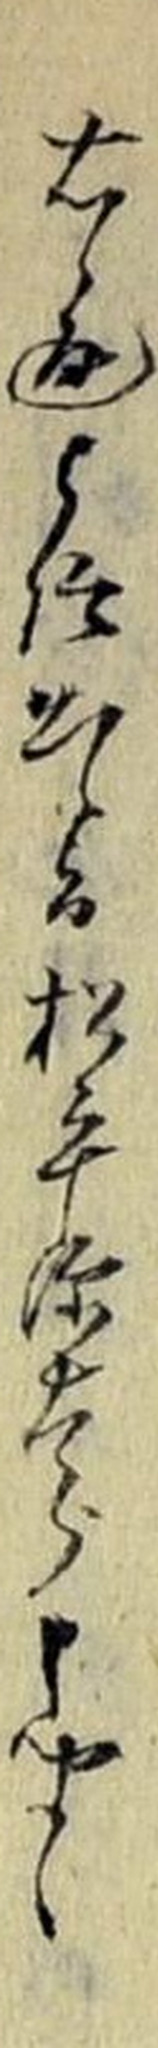右之通被仰出候間松平源太郎申聞之
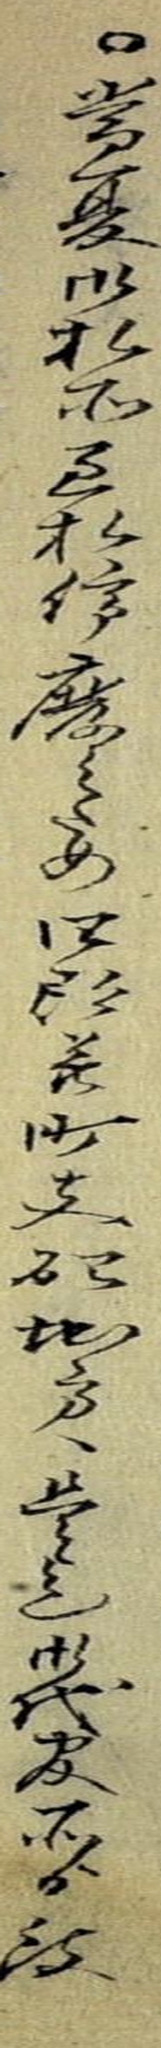○当夏御札所過札停廃之ため四郡并町支配地方へ是迄御代官所ゟ致
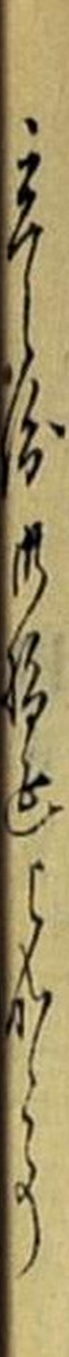立之儀御指延被成候事
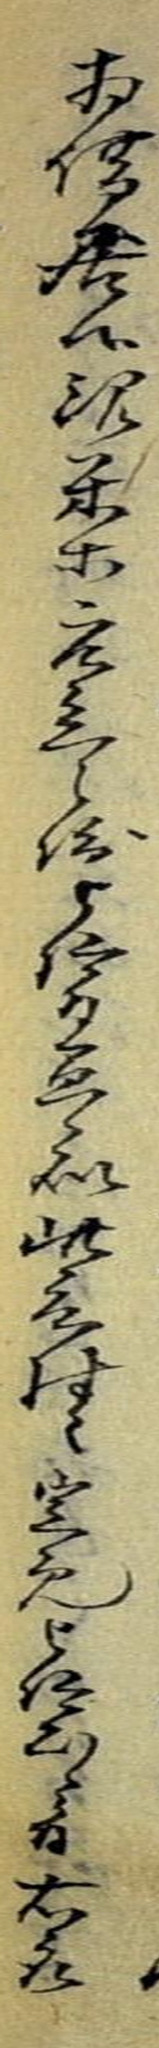御借居候銀米等取立之儀被仰付置候処此度村々定免被仰出候に付右取
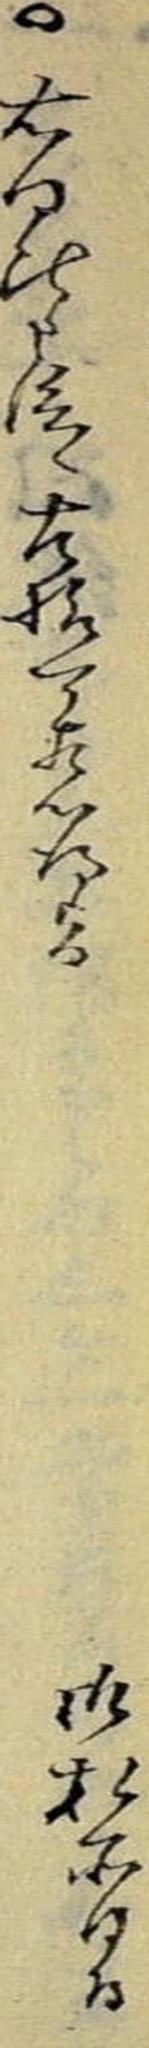○右同断申渡候左様可相心得旨御札所目付
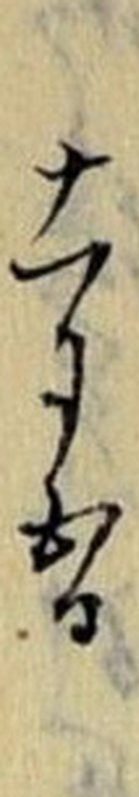十一月五日
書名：命令之部 六
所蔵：福井県文書館 Fukui Prefectural Archives
